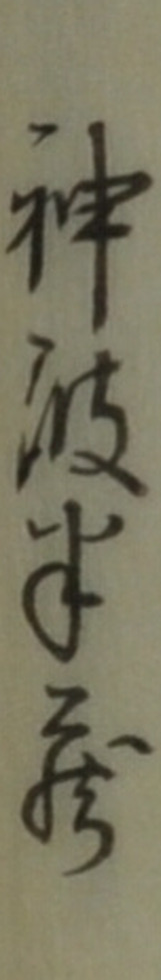神波半蔵
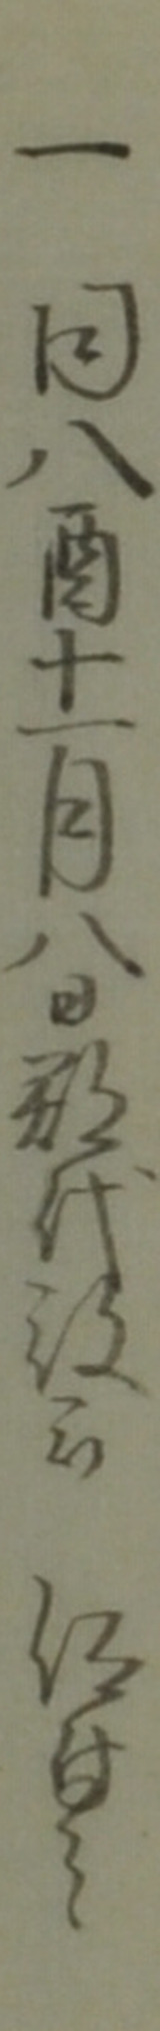一同八酉十一月八日郡代被仰付之
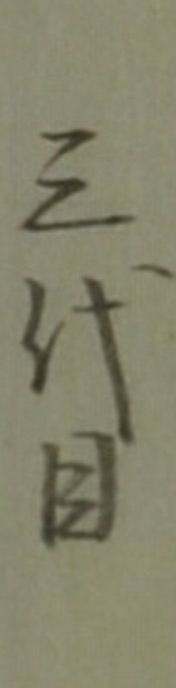三代目
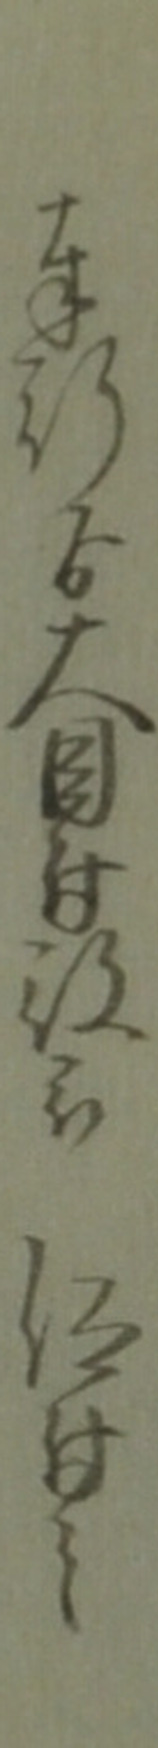奉行ゟ大目付役被仰付之
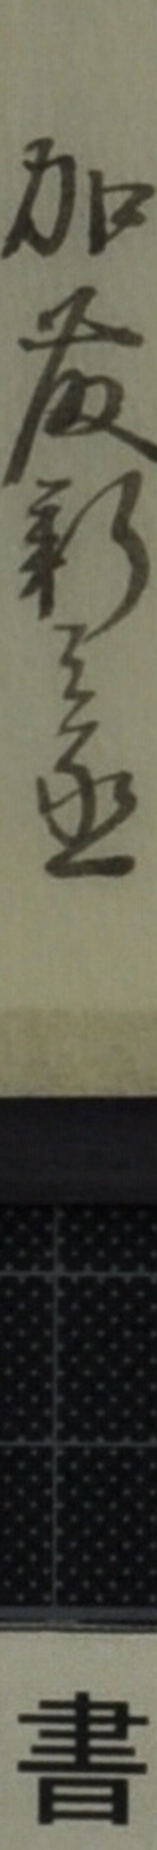加藤新之丞
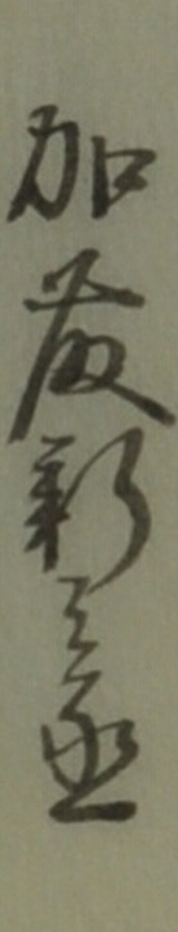加藤新之丞
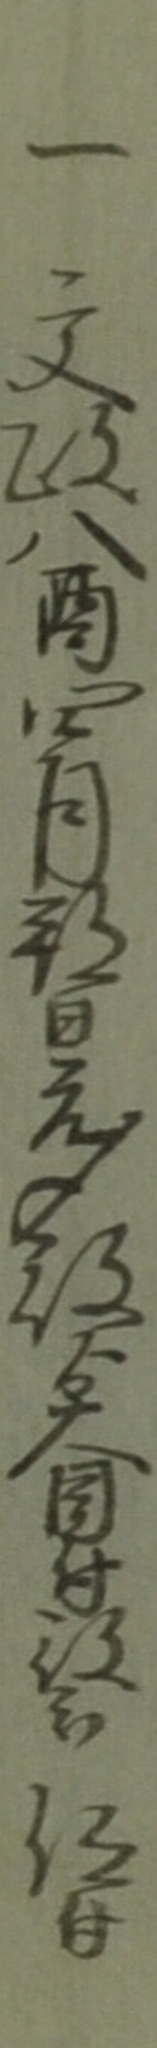一文政八酉四月朔日元〆役ゟ大目付役被仰付
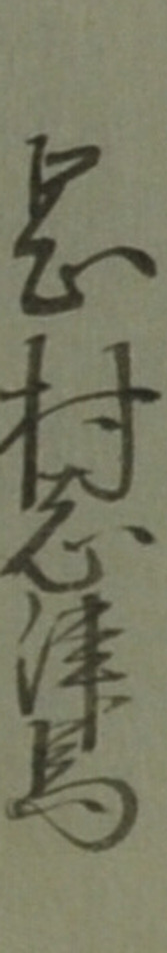岡村志津馬
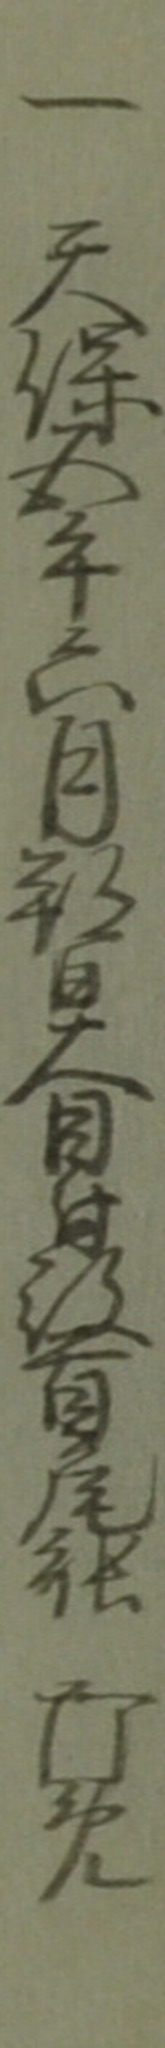一天保五午六月朔日大目付役首尾能御免
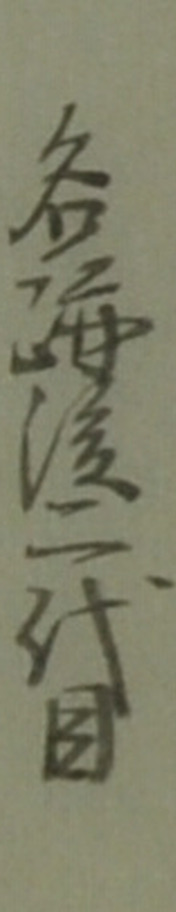名跡後二代目
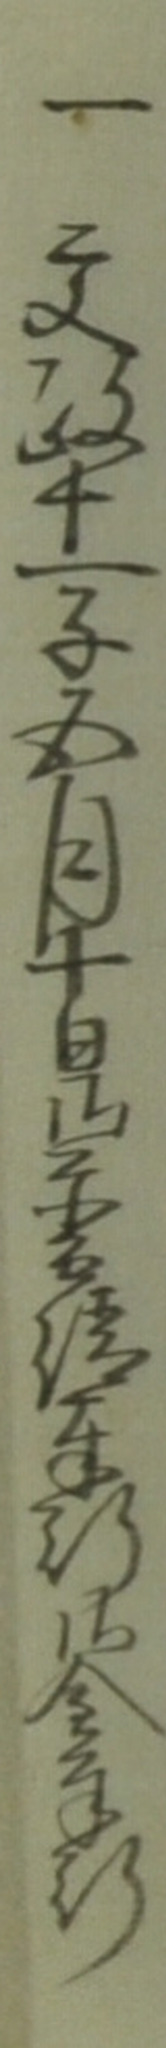一文政十一子五月十日御普請奉行御金奉行
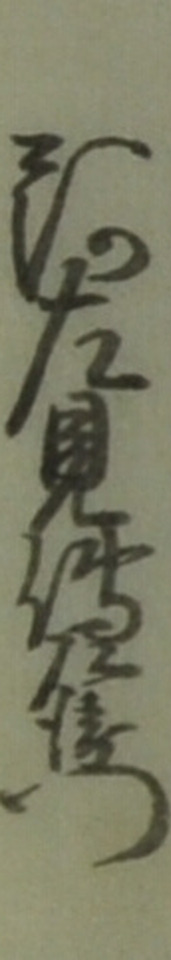阿左見伝左衛門

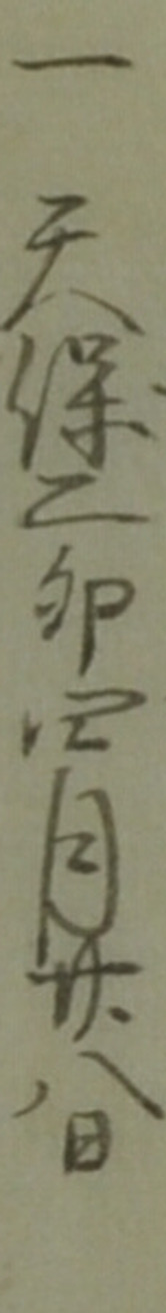一天保二卯四月廿八日
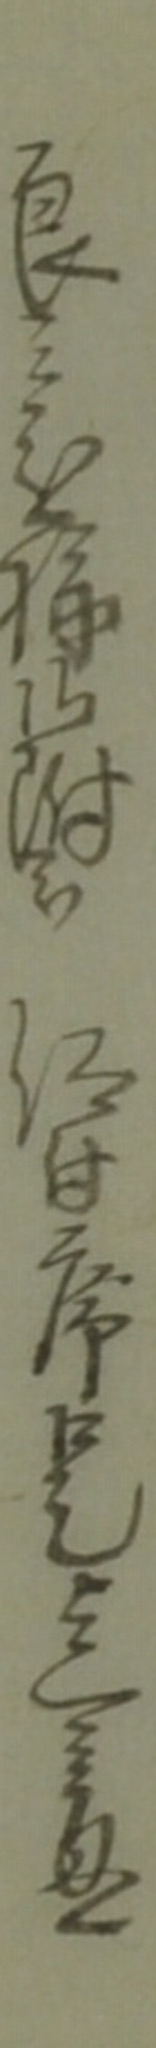良之進様御附被仰付席是迄之通
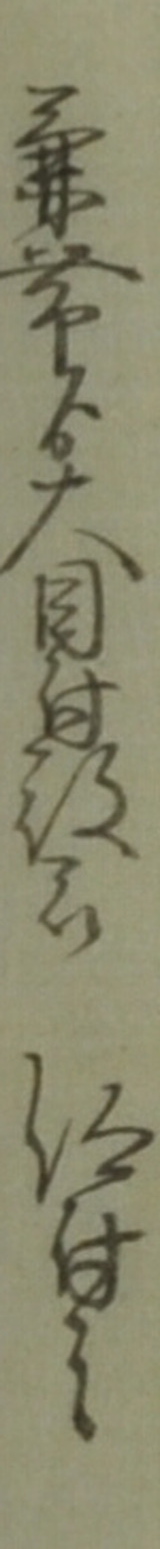兼帯ゟ大目付役被仰付之
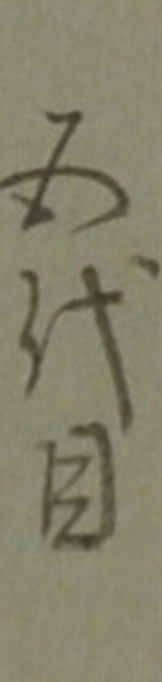五代目
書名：諸御役代々録（三）
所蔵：伊那市立高遠町図書館・合同会社AMANE
